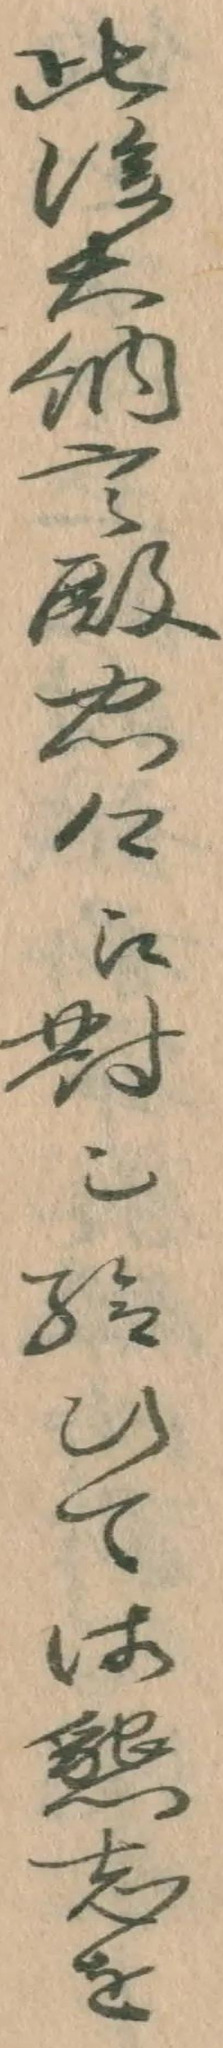此後大納言殿忠郷江対し給ひて御懇志を
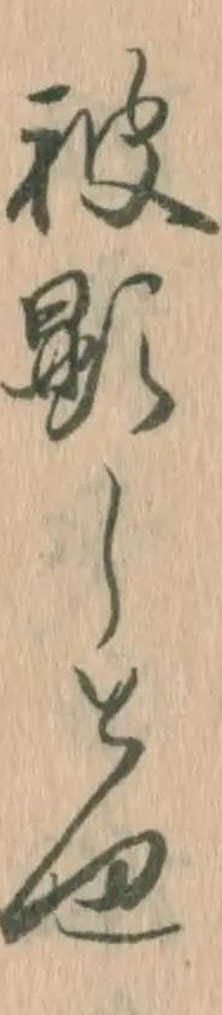被顕しと也
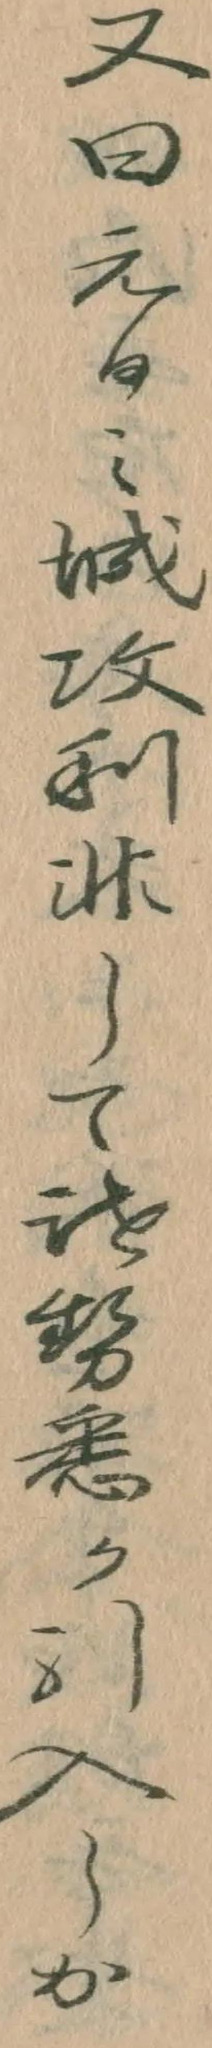又曰元日之城攻利非して諸勢悉く引入しか
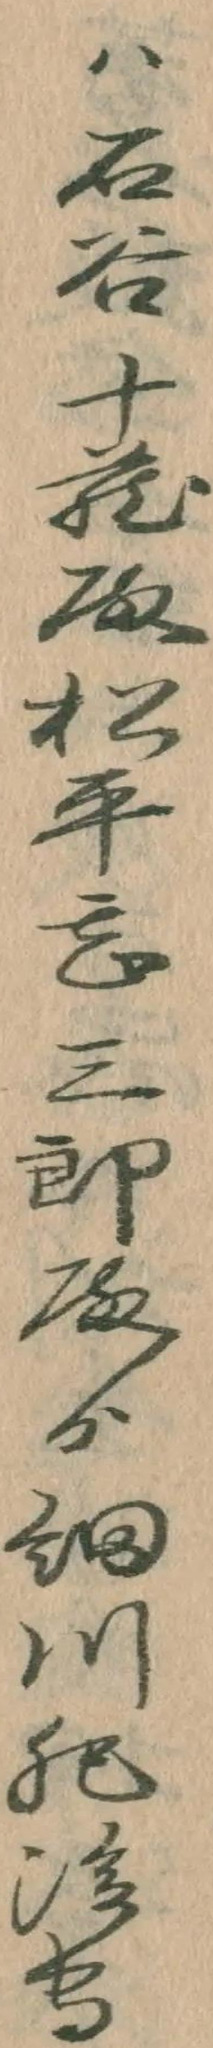は石谷十蔵殿松平甚三郎殿ゟ細川肥後守
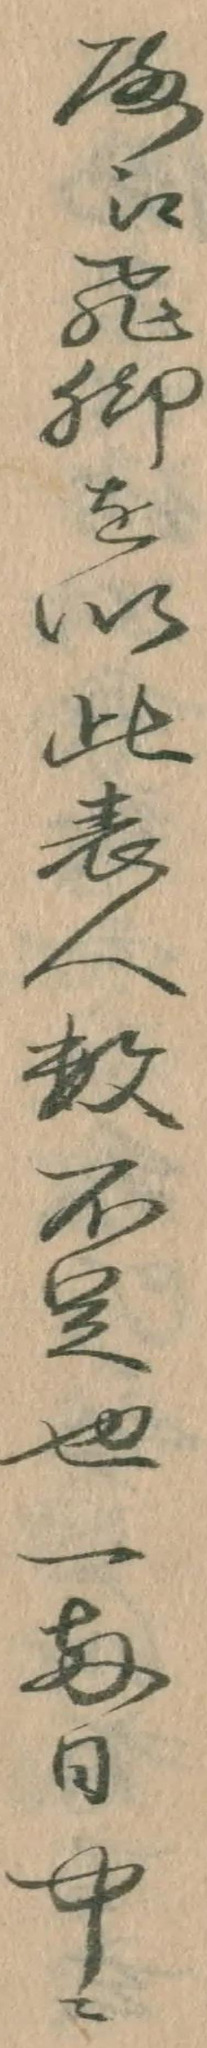殿江飛脚を以此表人数不足也一両日中に
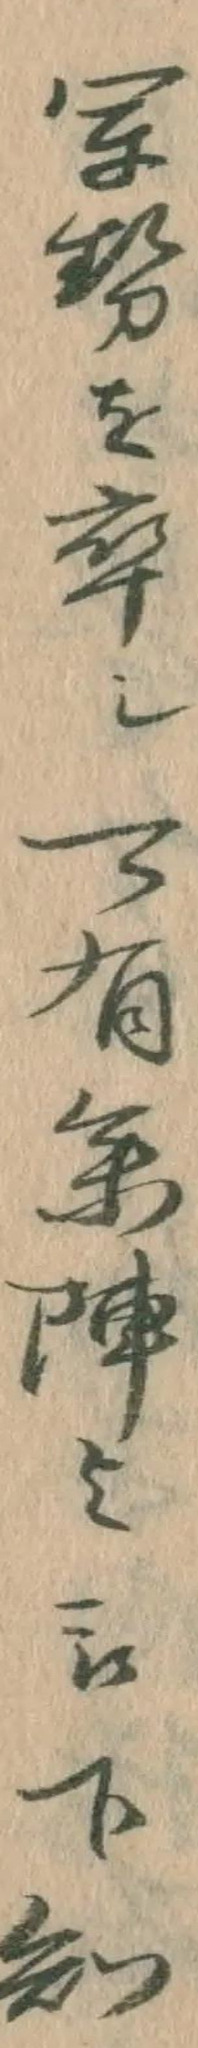軍勢を卒し可有参陣与被下知
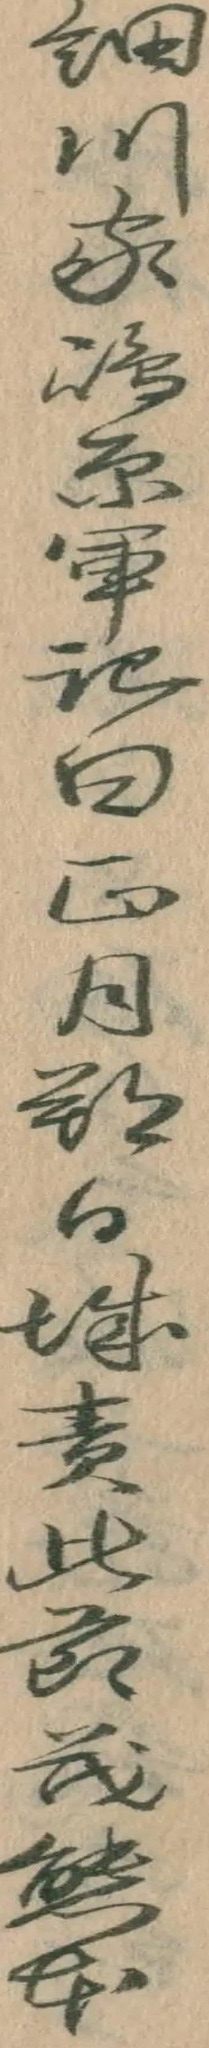細川家島原軍記曰正月朔日城責此節も熊本
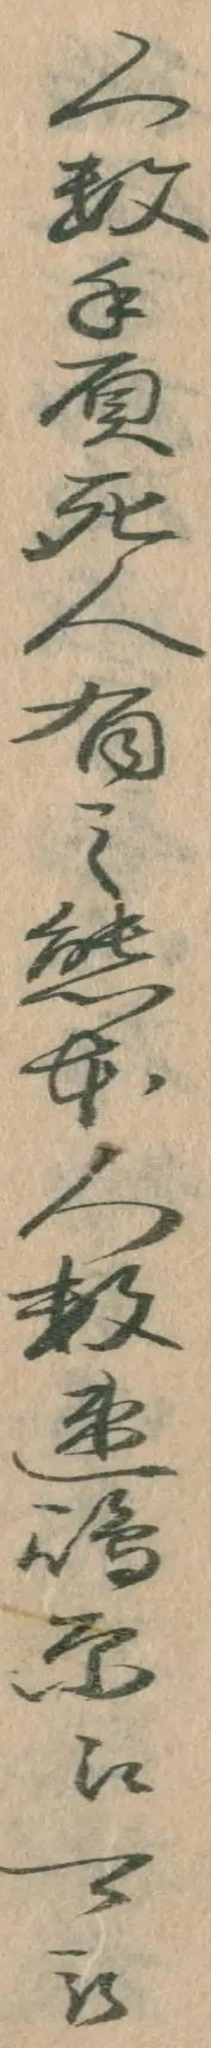人数手負死人有之熊本人数速島原江可被
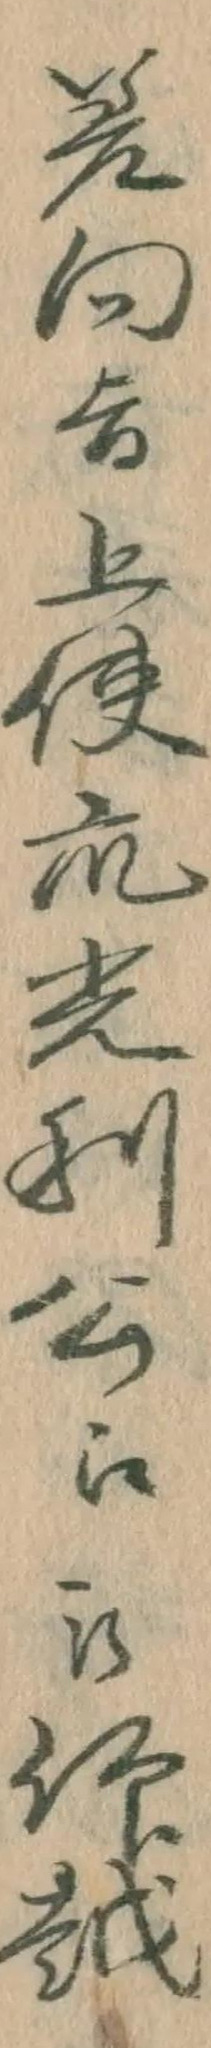差向旨上使衆光利公被仰越
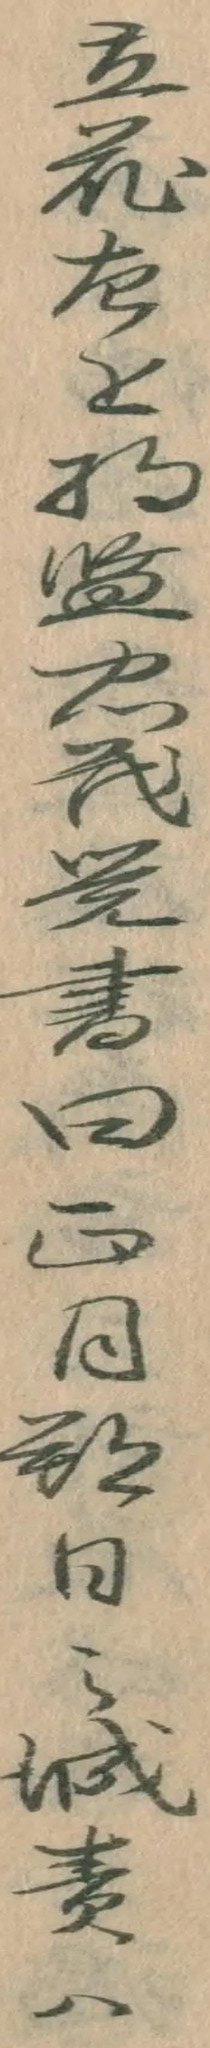立花左近将監忠茂覚書曰正月朔日之城責は
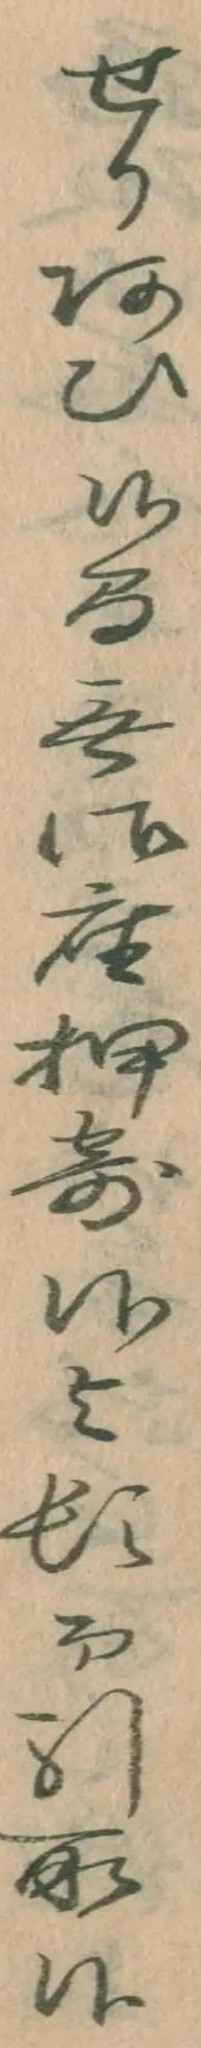せり阿ひ候間無御座押寄候与頓而引取候
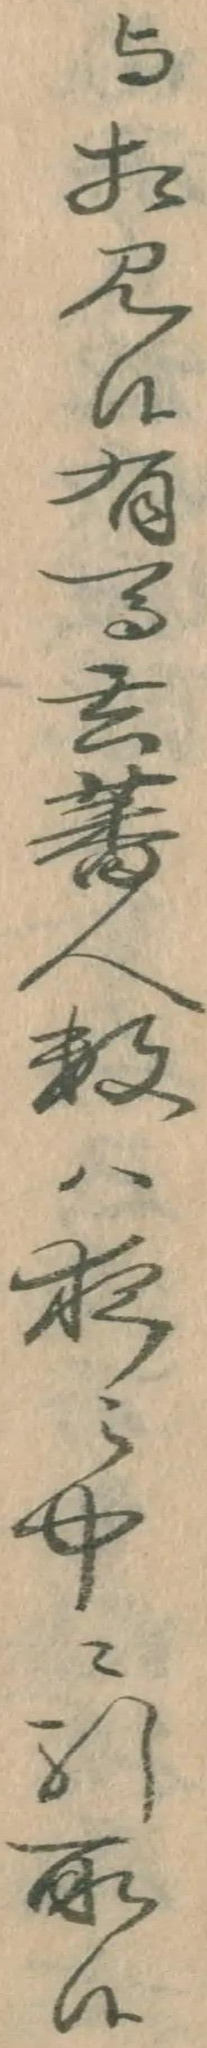与相見候有馬玄蕃人数は夜之中に引取候

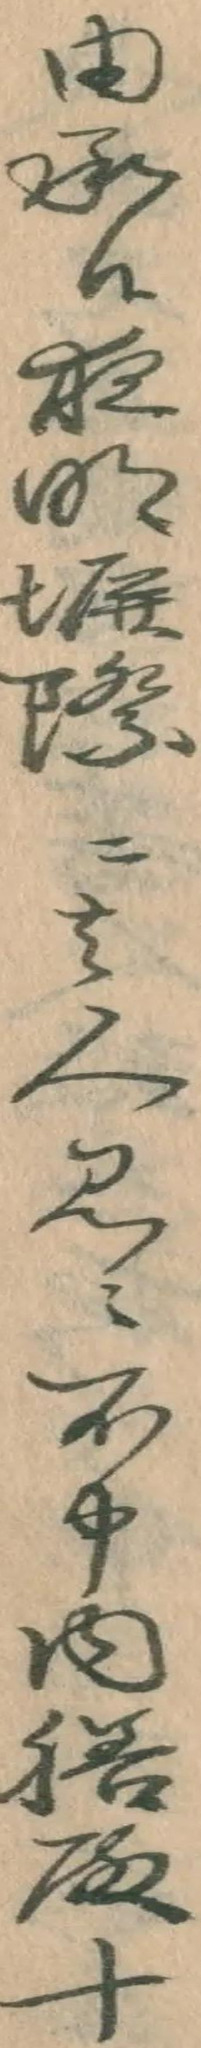由承候夜明塀際に者人見之不申内膳殿十
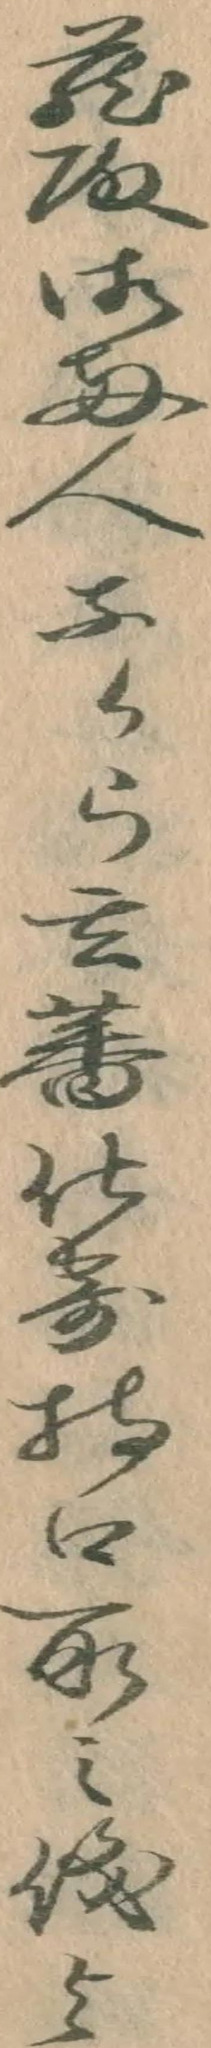蔵殿御両人なから玄蕃仕寄持口取之儀与
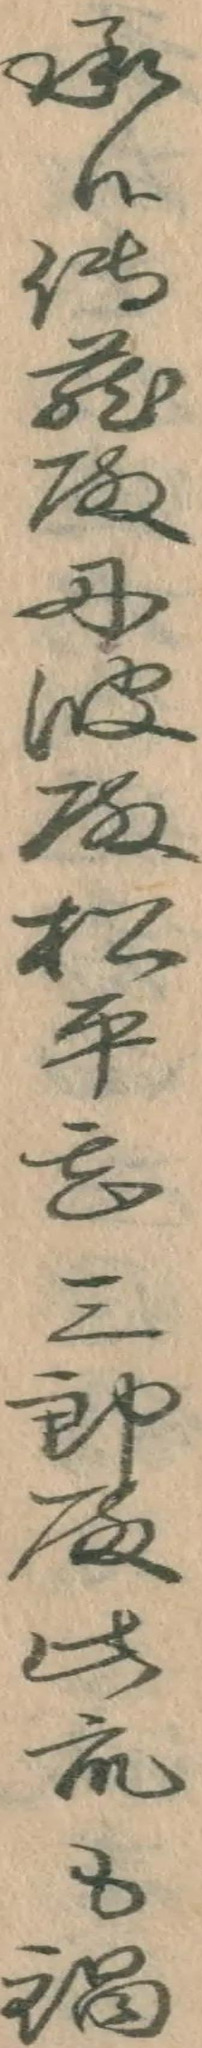承候伝蔵殿丹波殿松平甚三郎殿此衆も鍋
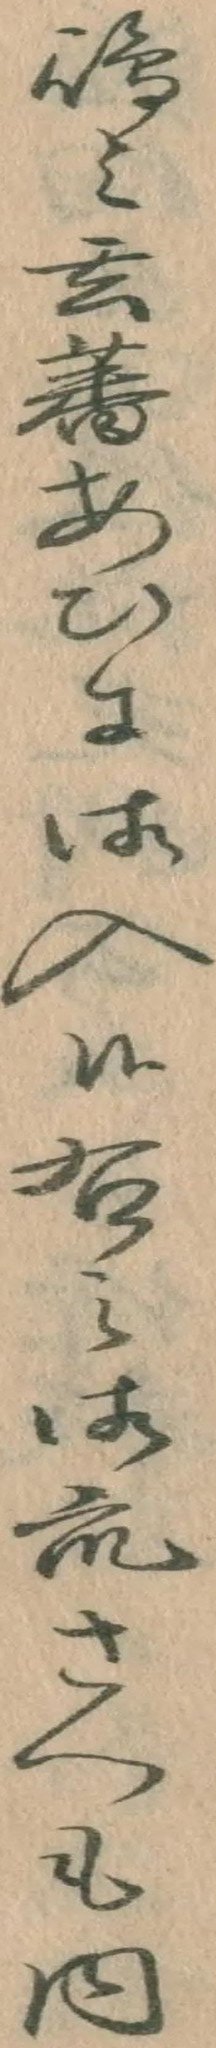島与玄蕃あひ尓御入候右之御衆さへも内
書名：切支丹御退治記 49巻. [5]
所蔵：国立国会図書館 National Diet Library, JAPAN
